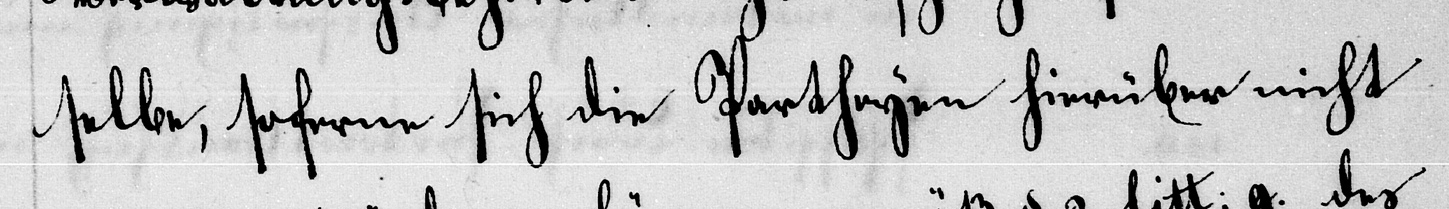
selbe, sofern sich die Partheyen hierüber nicht
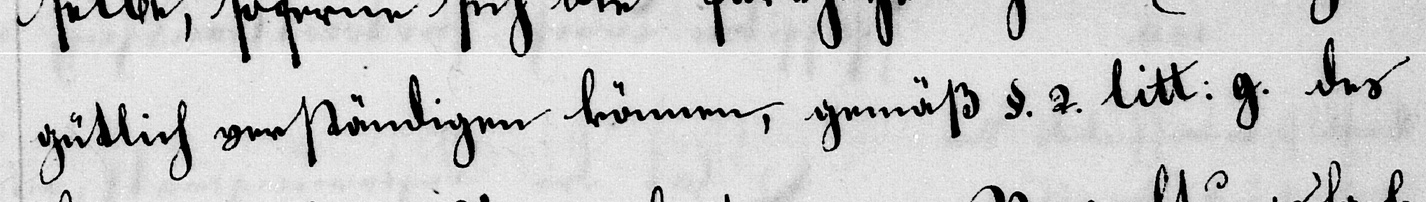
gütlich verständigen können, gemäß §. 2. litt: g. des
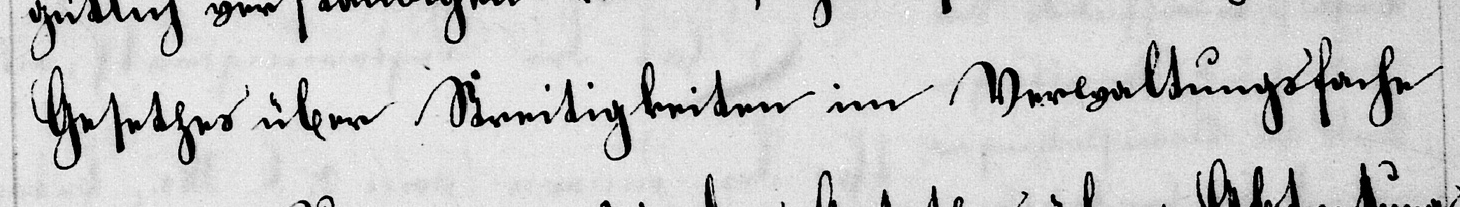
Gesetzes über Streitigkeiten im Verwaltungsfache
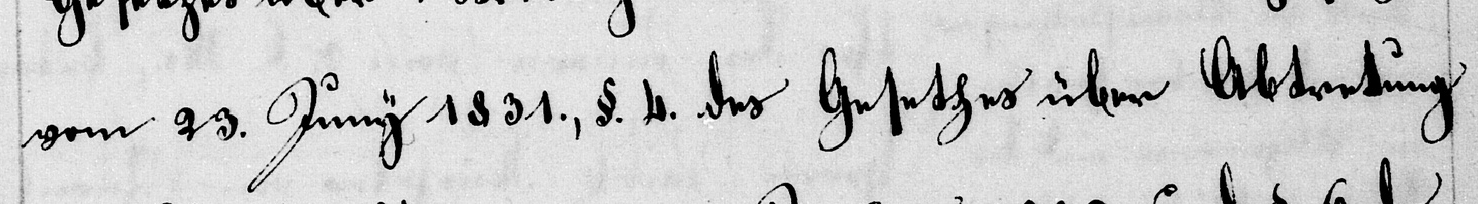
vom 23. Juny 1831., §. 4. des Gesetzes über Abtretung
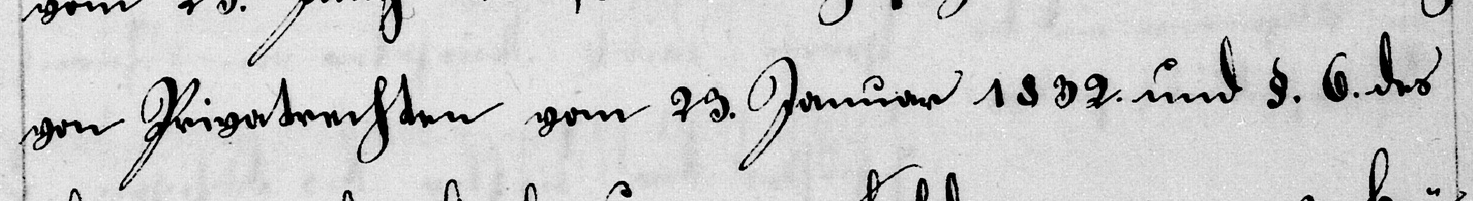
von Privatrechten vom 23. Januar 1832. und §. 6. des
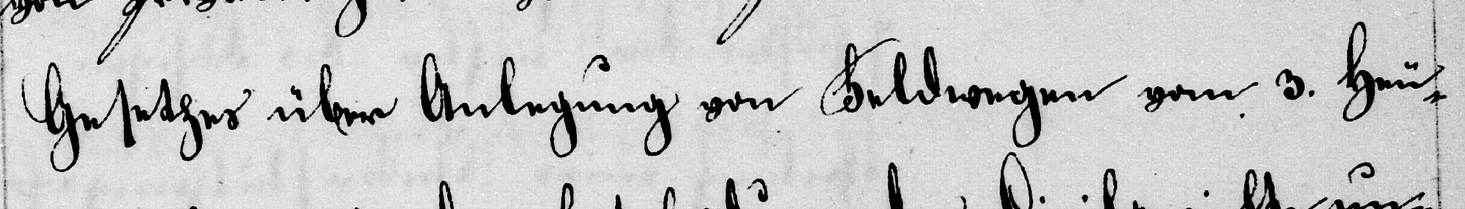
Gesetzes über Anlegung von Feldwegen vom 3. Heu¬
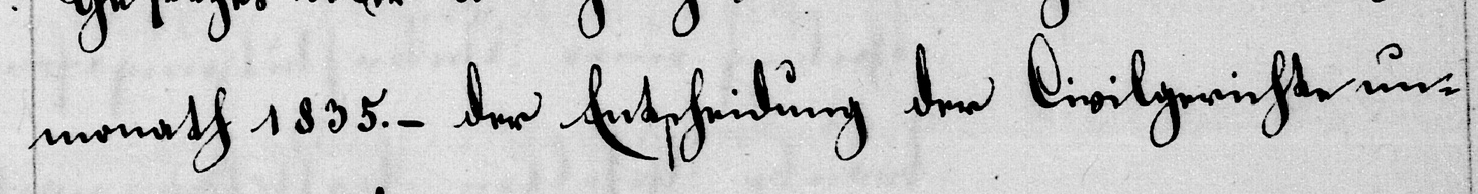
monath 1835. – der Entscheidung der Civilgerichte un¬
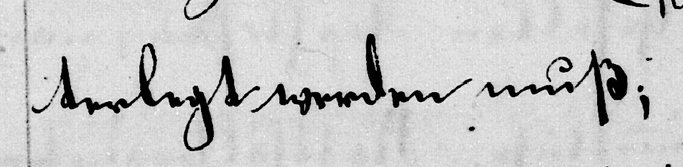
terlegt werden muß;
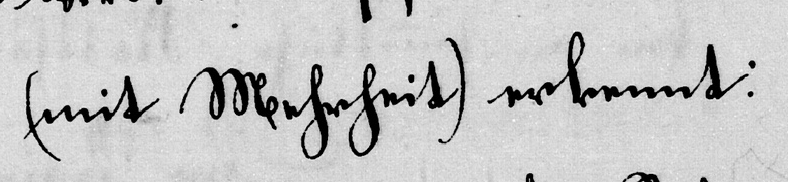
(mit Mehrheit) erkennt:
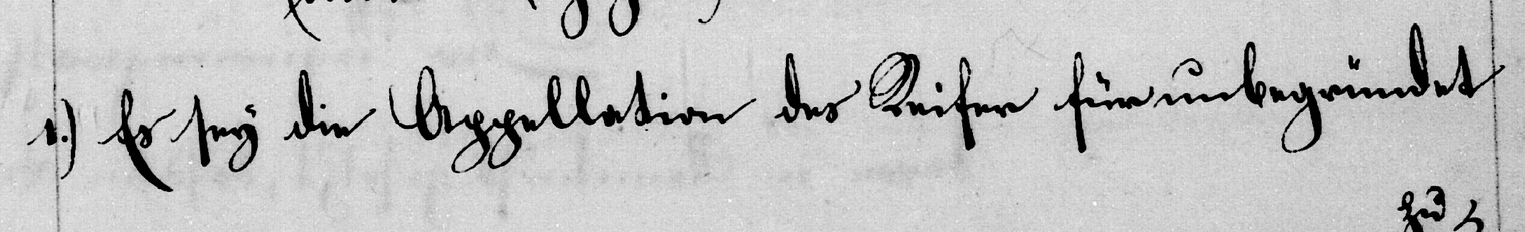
1.) Es sey die Appellation des Reifer für unbegründet
